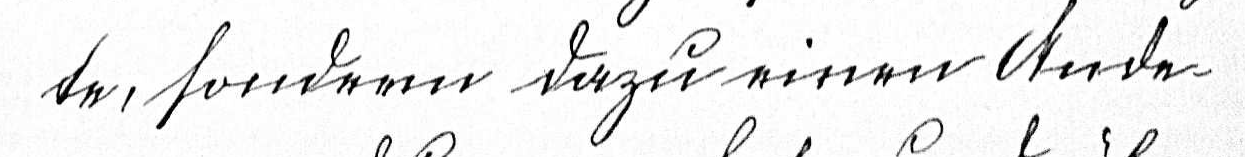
te, sondern dazu einer Ande¬
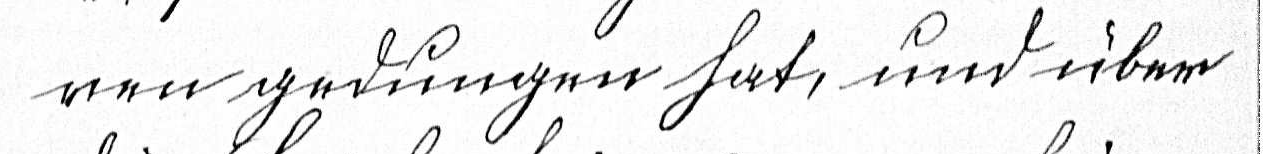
ren gedungen hat, und über
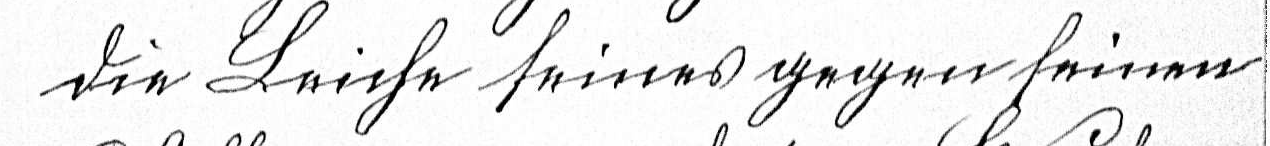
die Leiche seines gegen seinen
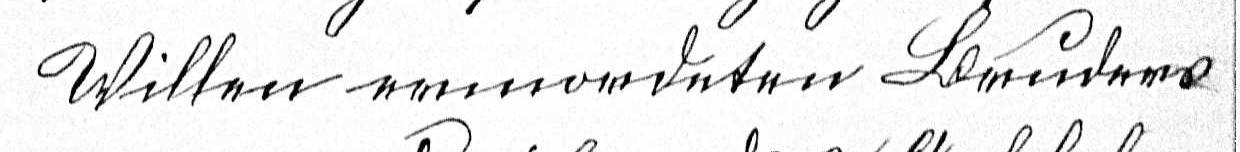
Wilen ermordeten Bruders
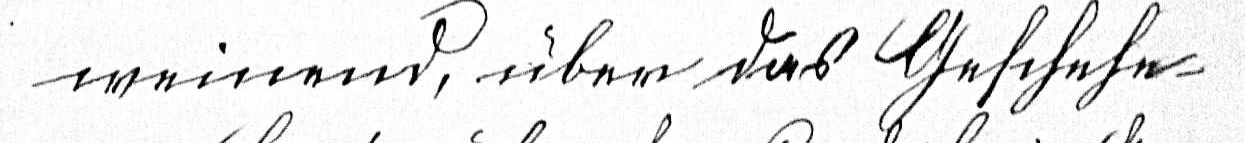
weinend, über das Geschehe¬
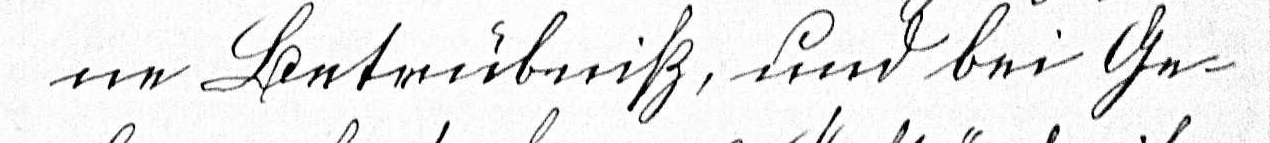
ne Betrübniß, und bei Ge¬
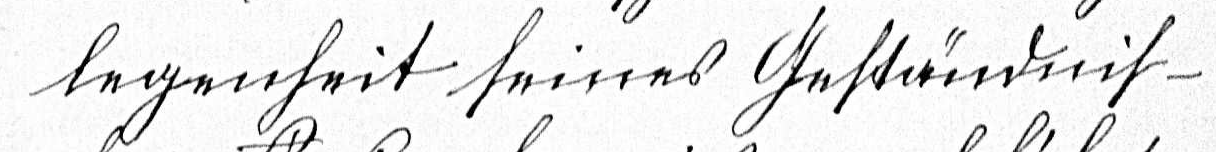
legenheit seines Geständnis¬
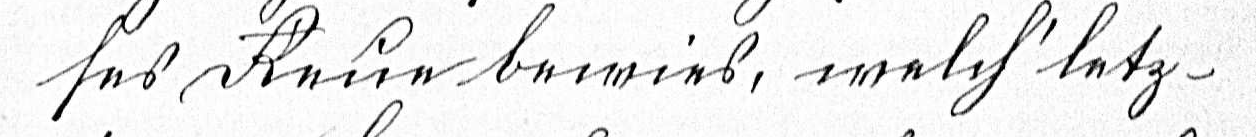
ses Reue bewies, welch’ letz¬
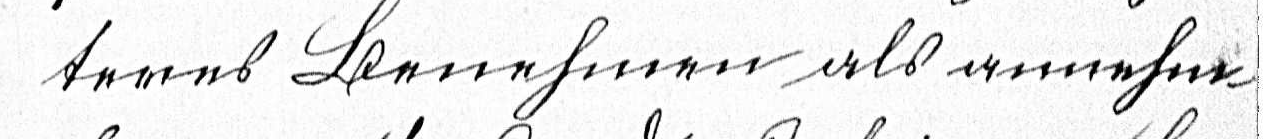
teres Benehmen als annehm¬
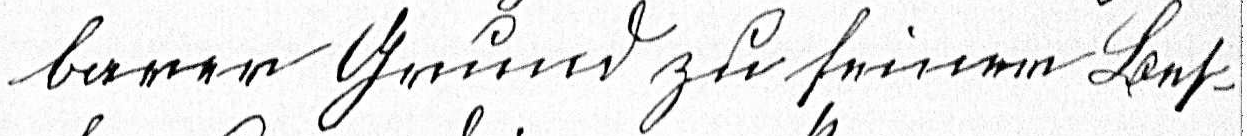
barer Grund zu seiner Bes¬
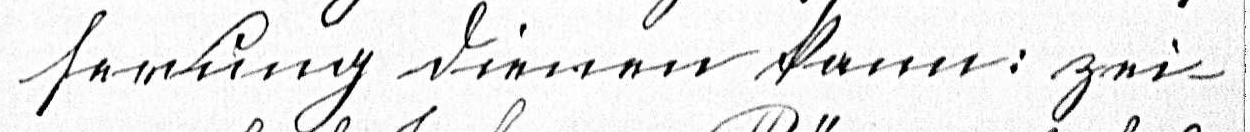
serung dienen kann: zei¬
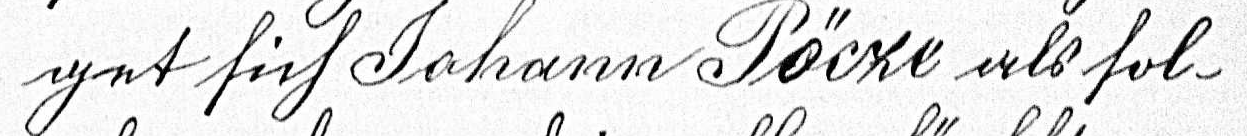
get sich Johann Pöcze als sol¬
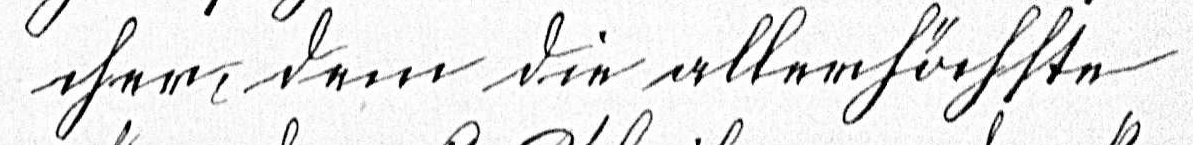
cher, dem die allerhöchste
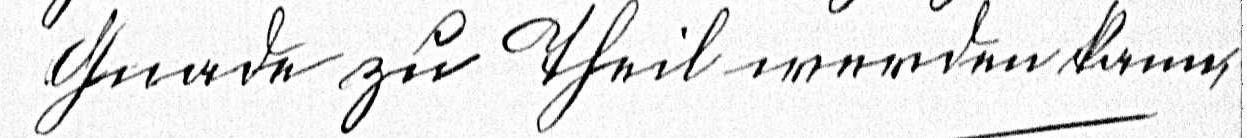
Gnade zu Theil werden kann
